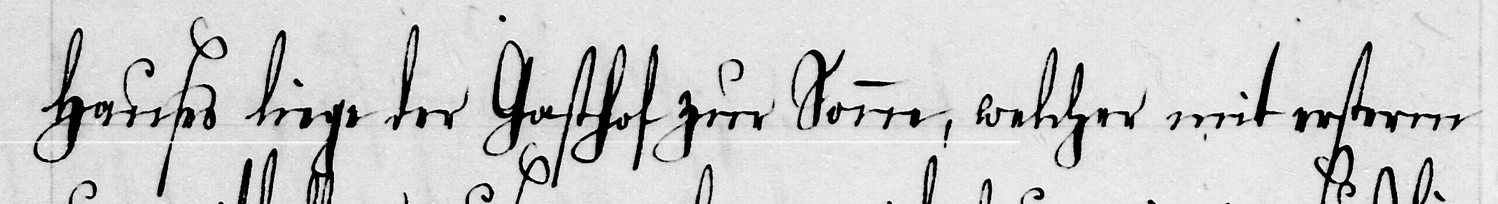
Hauses liege der Gasthof zur Sonne, welcher mit ersterm
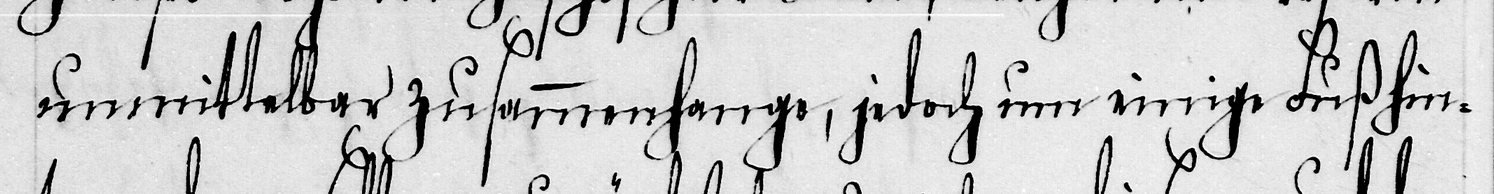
unmittelbar zusammenhange, jedoch um einige Fuß hin¬
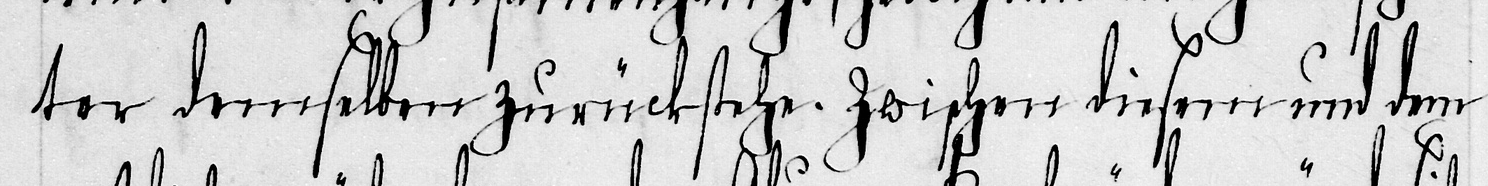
ter demselben zurückstehe. Zwischen diesem und dem
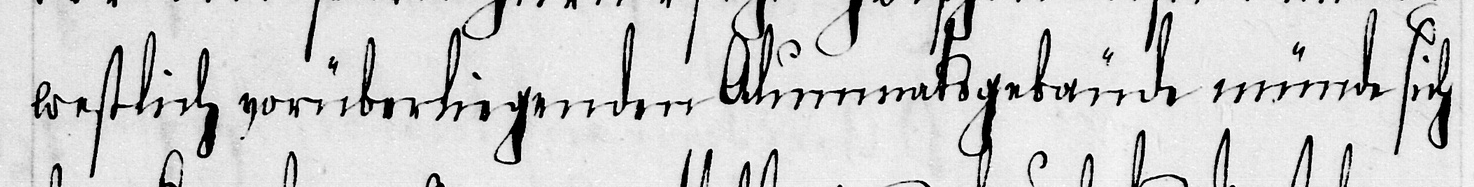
westlich vorüberliegenden Alumnatsgebäude münde sich
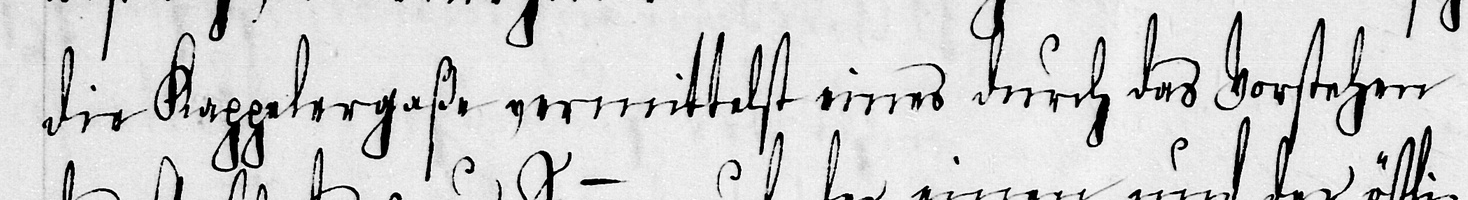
die Kappelergaße vermittelst eines durch das Vorstehen
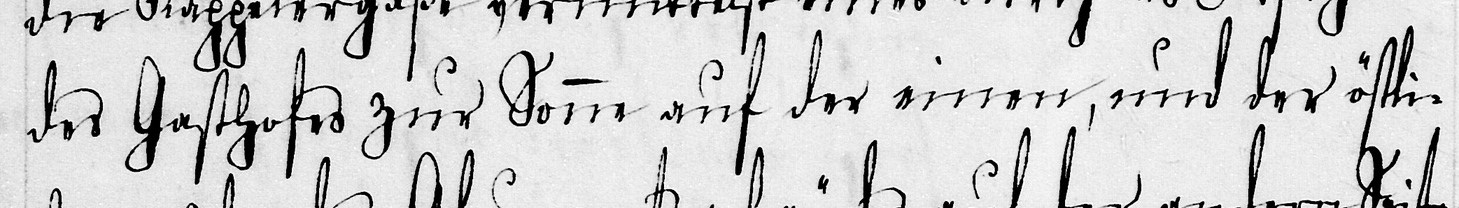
des Gasthofes zur Sonne auf der einen, und der östli¬
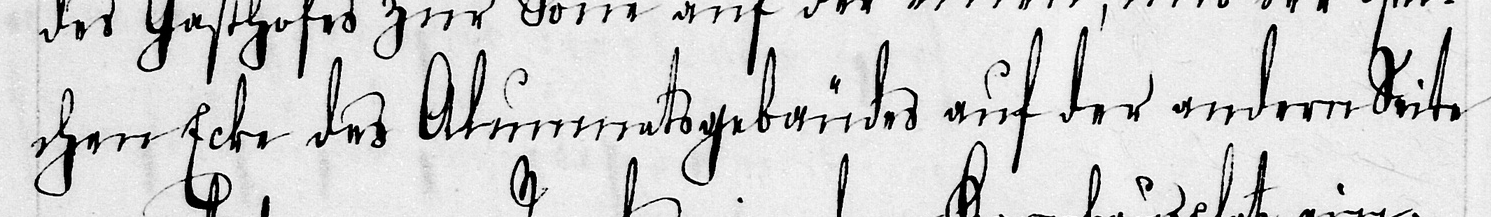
chen Ecke des Alumnatsgebäudes auf der andern Seite
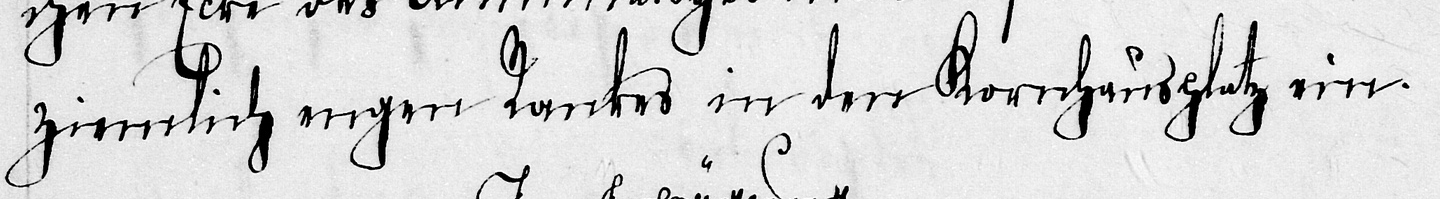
ziemlich engen Rankes in den Kornhausplatz ein.
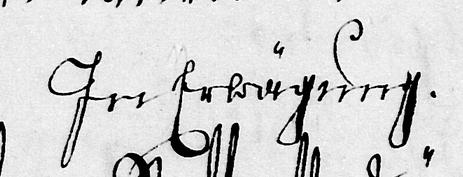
In Erwägung.
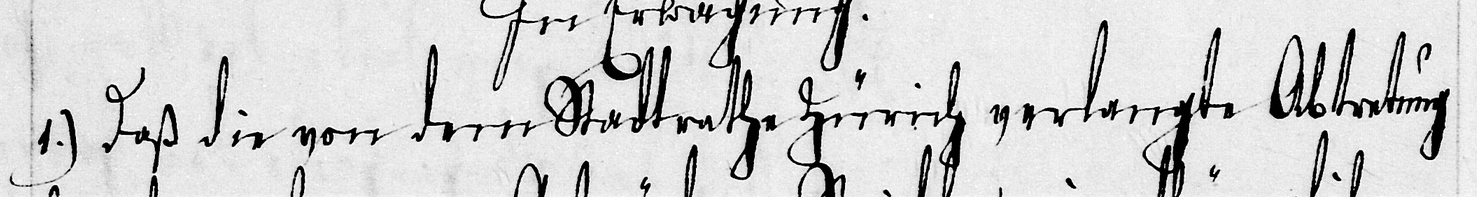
1.) Daß die von dem Stadtrathe Zürich verlangte Abtretung
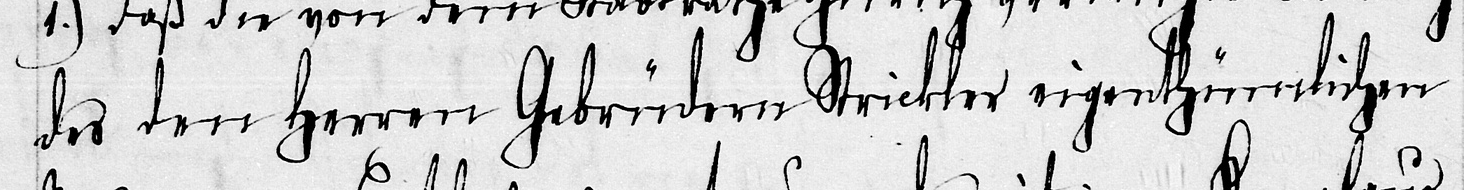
des den Herren Gebrüdern Strickler eigenthümlichen
